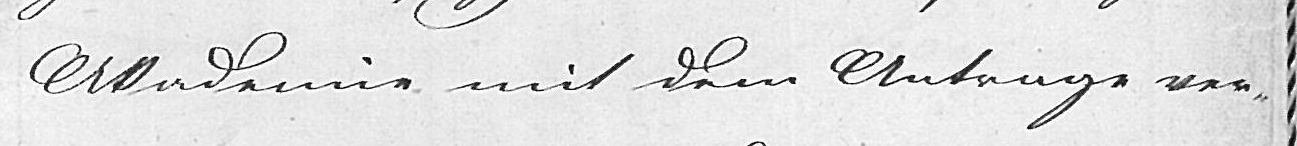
Akademie mit den Antrage ver-
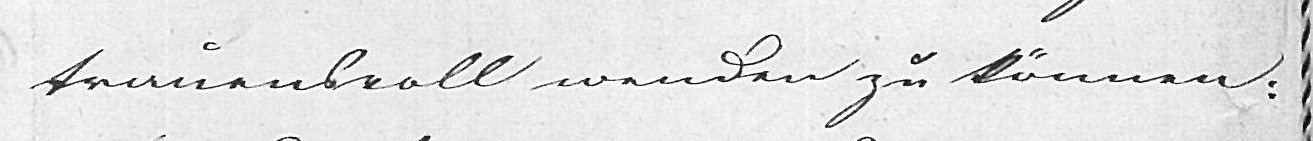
trauensvoll wenden zu können:
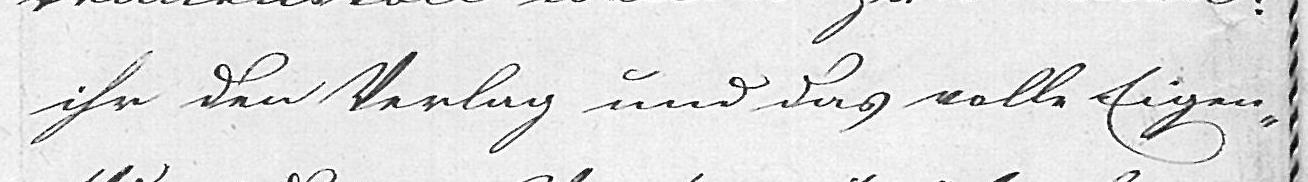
ihr den Verlag und das volle Eigen-
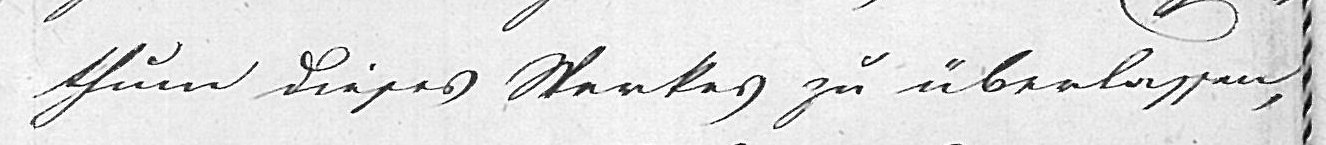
thum dieses Werkes zu überlassen,
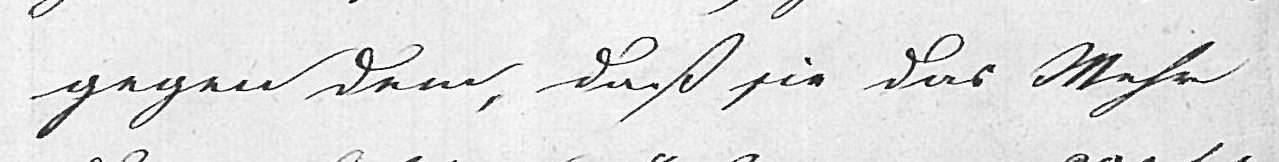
gegen dem, daß sie das Mehr
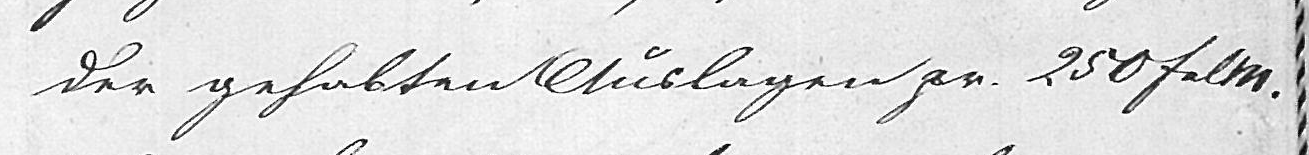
der gehabten Auslagen pr 250 fl. CM
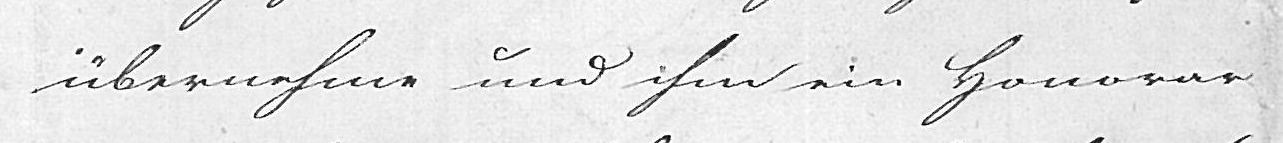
übernehme und ihm ein Honorar
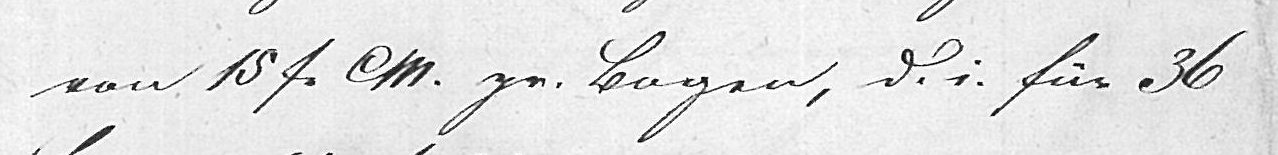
von 15 fl. CM. pr. Bogen, d. i. für 36
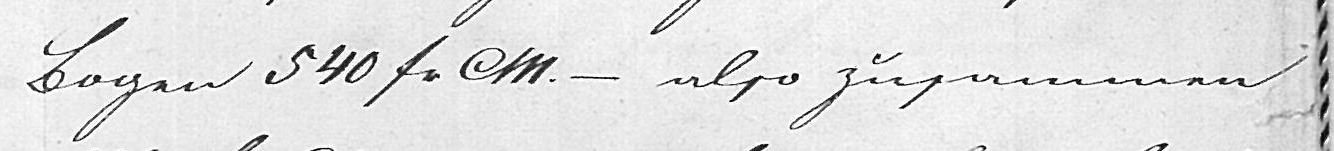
Bogen 540 fr CM - also zusammen
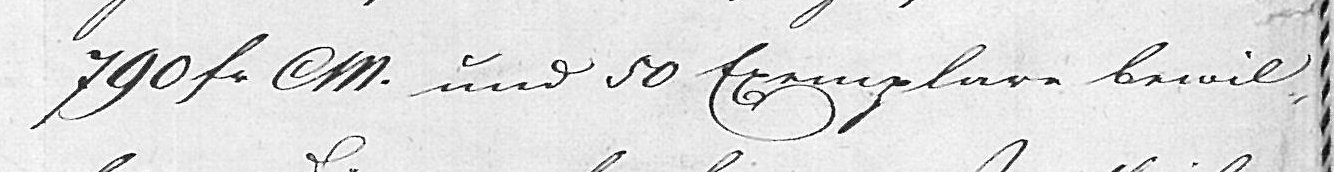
790 fr CM. und 50 Exemplare bewil-
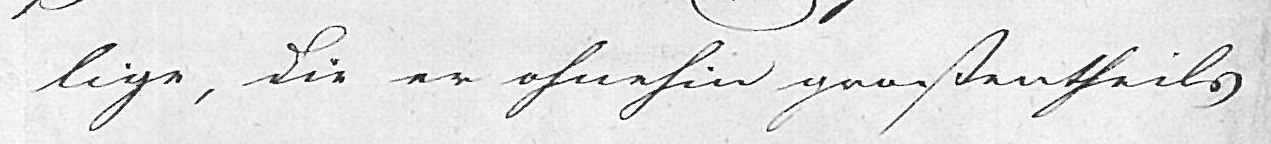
lige, die er ohnehin gröstentheils
